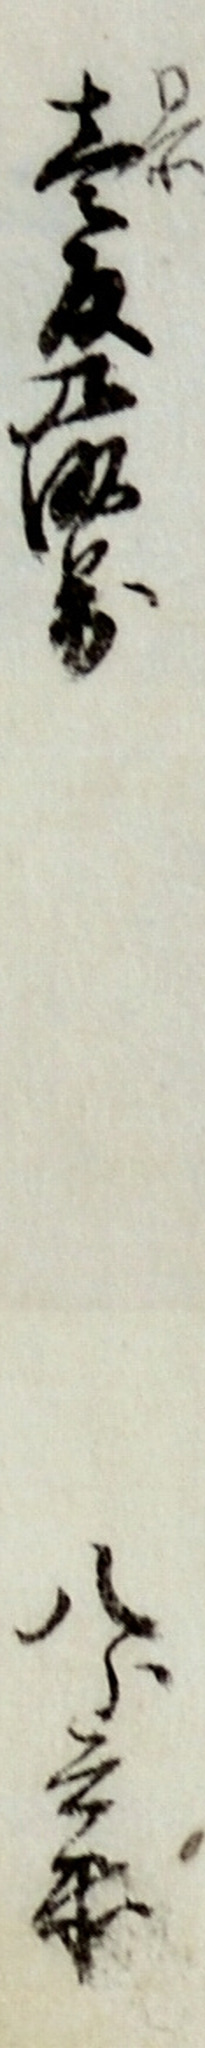壱反九畝歩八郎兵衛

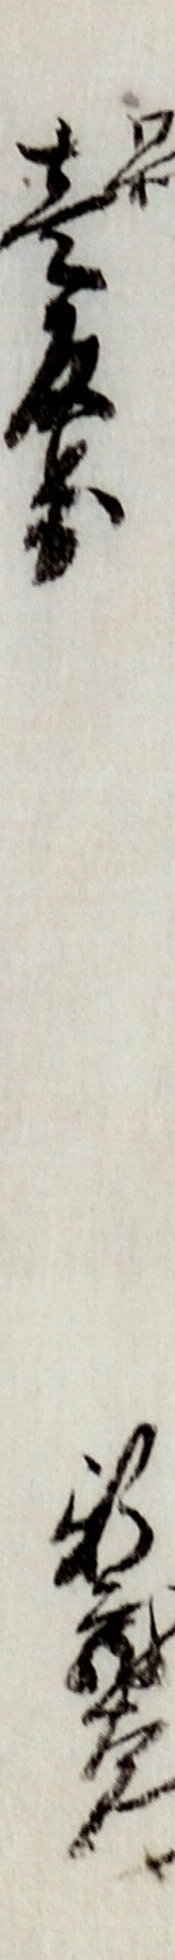壱反歩新蔵右衛門
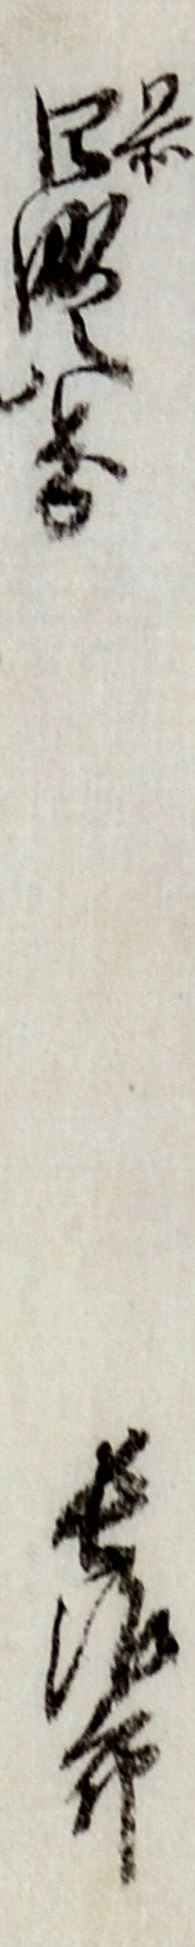四畝八歩長治郎
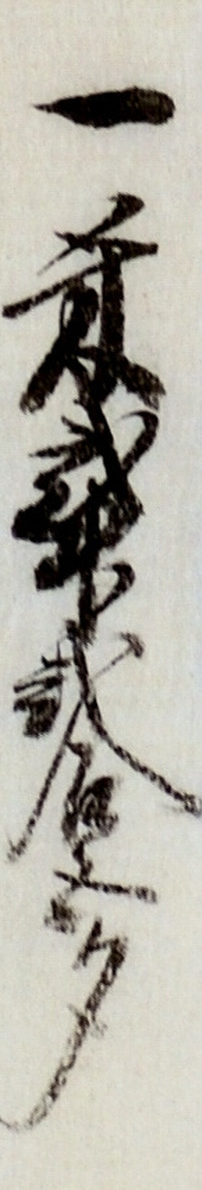一米弐升弐合五勺
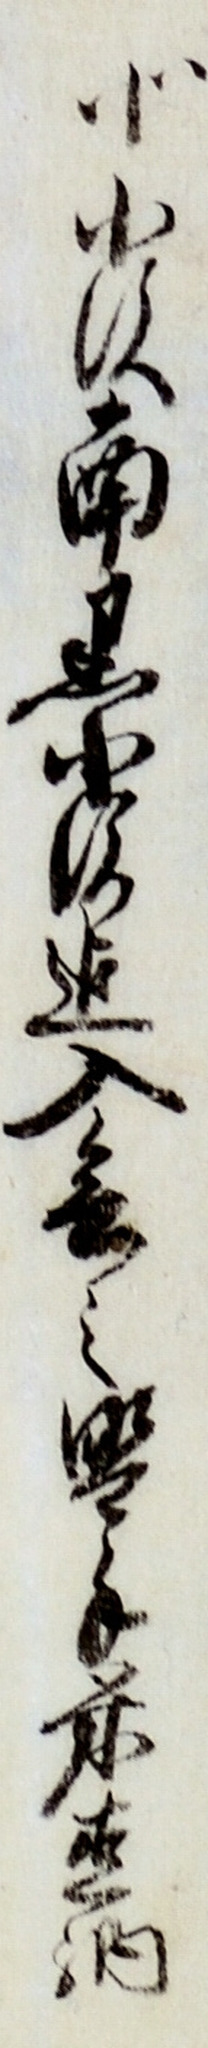北小沢南黒小沢迄入会之野手米直納
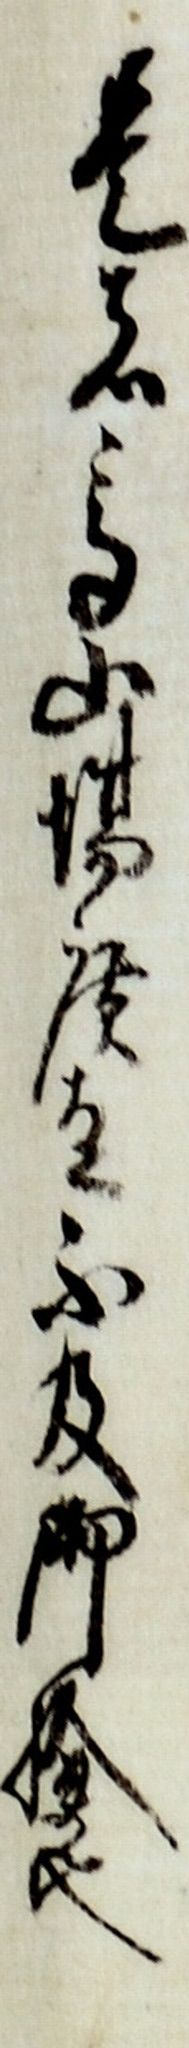是は高山場広故不及御検地
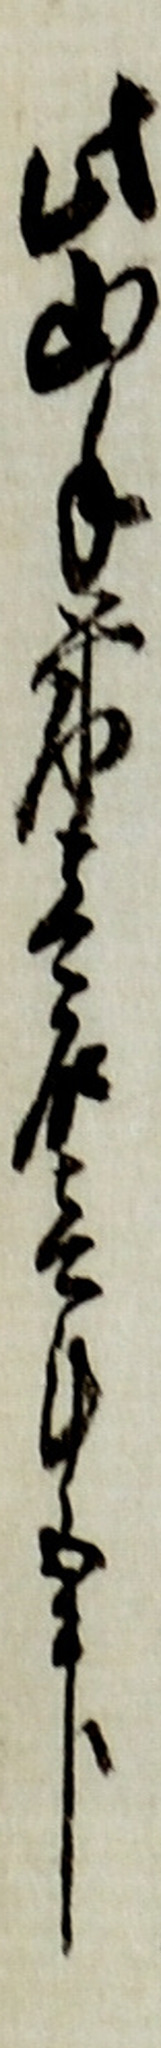此山手米壱石壱斗五升
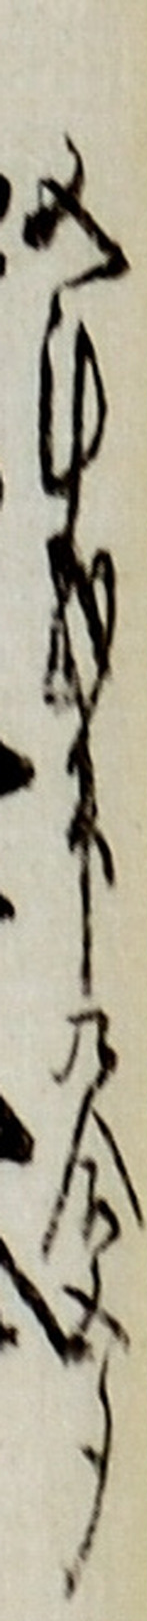一米弐升弐合五勺
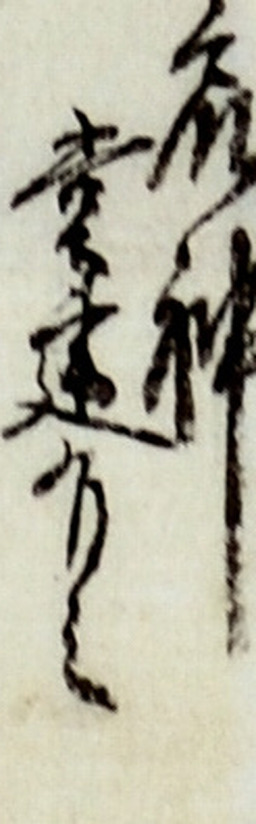堂建有之
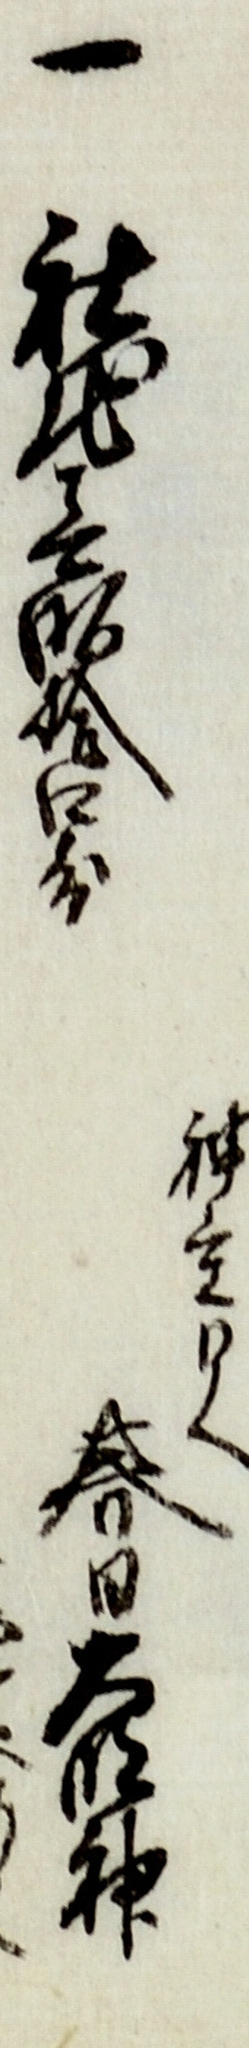一社地壱畝拾四歩春日大明神
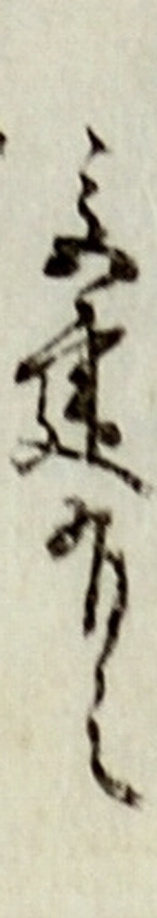宮建有之
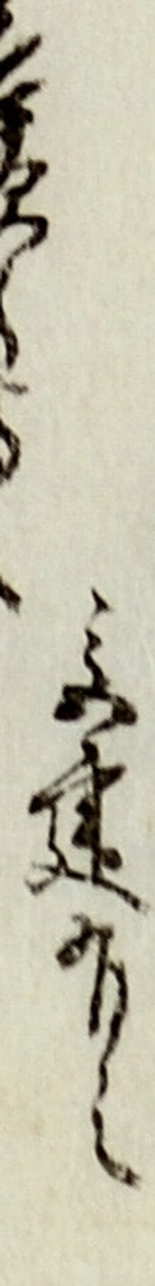宮建有之
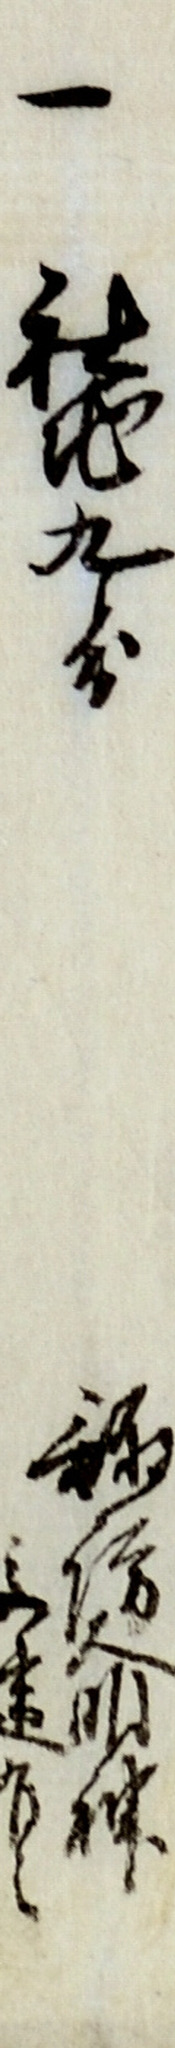一社地九歩諏訪大明神
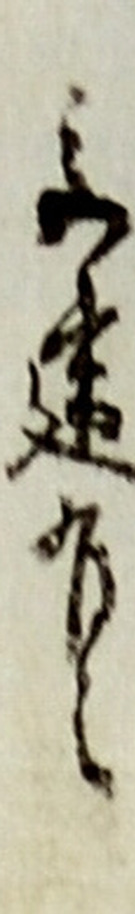宮建有之
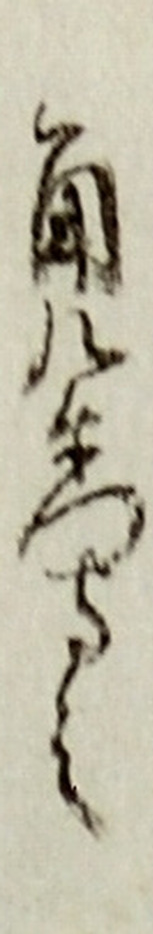角八衛門守之
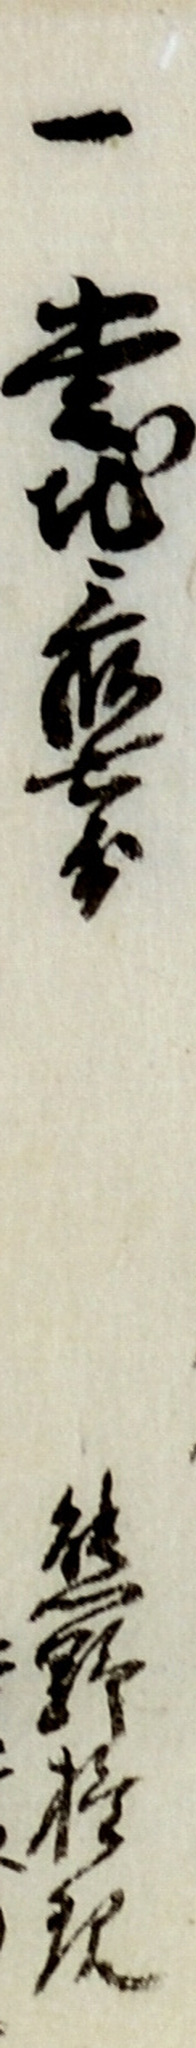一堂地三畝六歩熊野権現
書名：御領分中山林社地手控
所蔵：伊那市立高遠町図書館・合同会社AMANE
